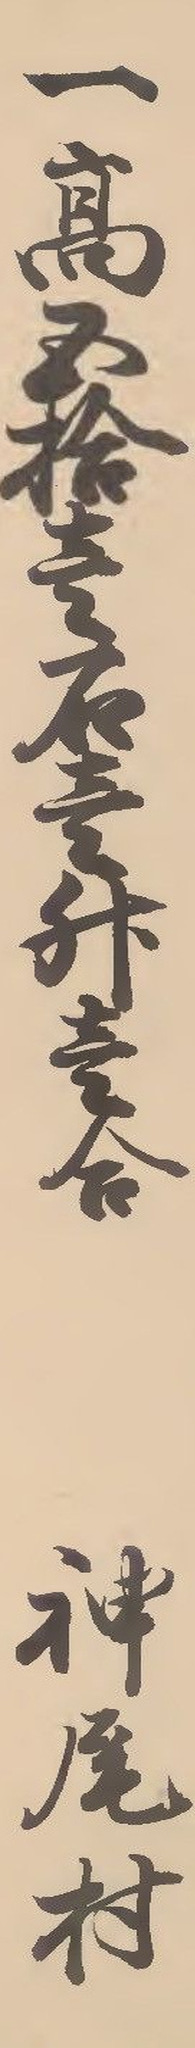一高五拾壱石壱升壱合神尾村
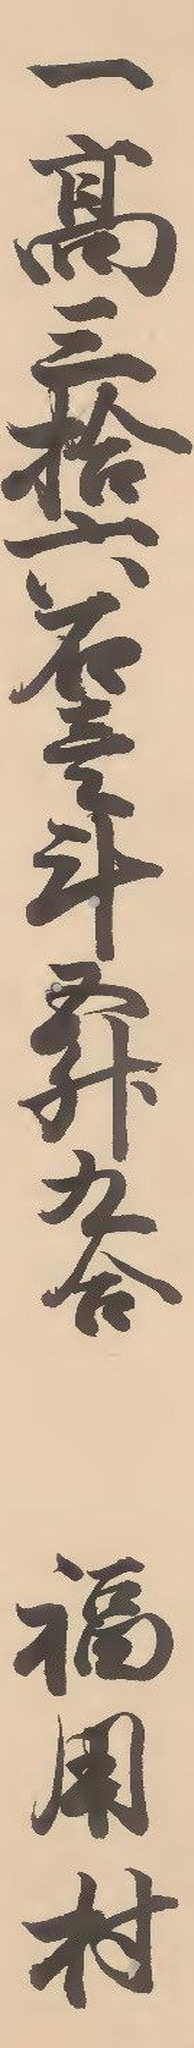一高三拾六石壱斗五升九合福用村
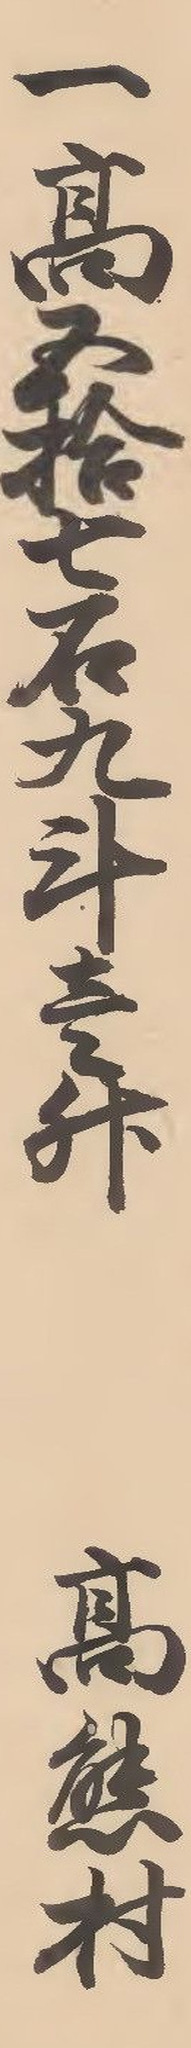一高五拾七石九斗壱升高熊村
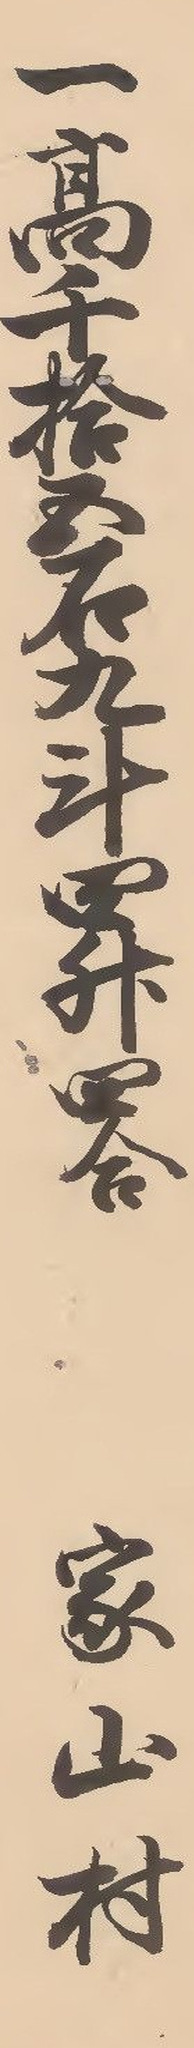一高千拾五石九斗四升四合家山村

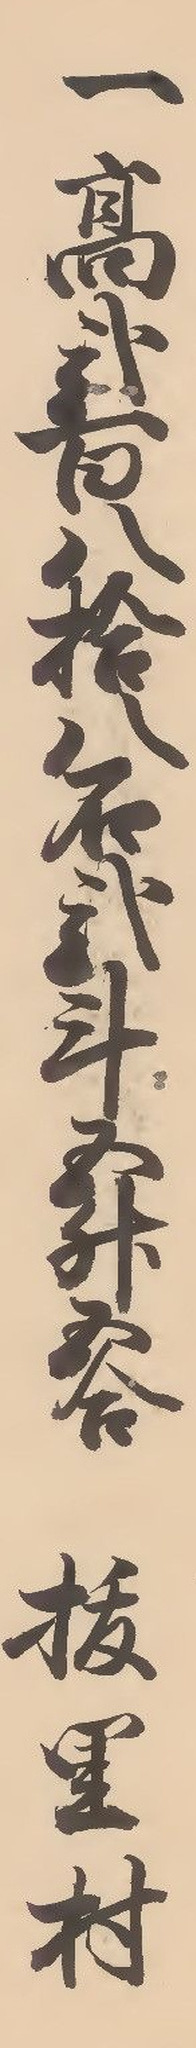一高弐百八拾八石弐斗五升五合抜里村
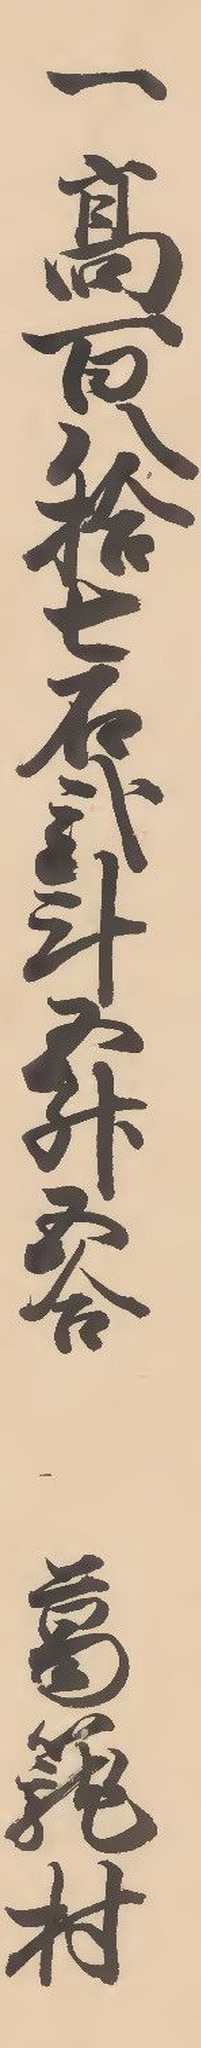一高百八拾七石弐斗五升五合葛籠村
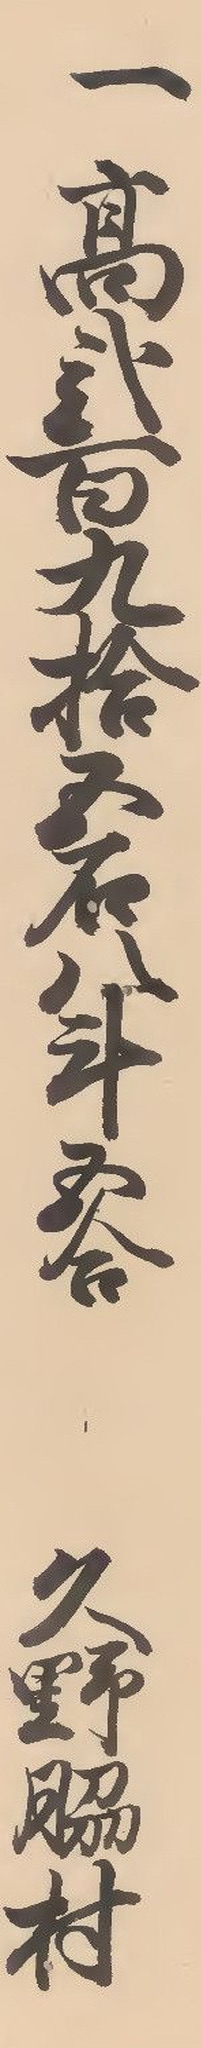一高弐百九拾五石八斗五合久野脇村
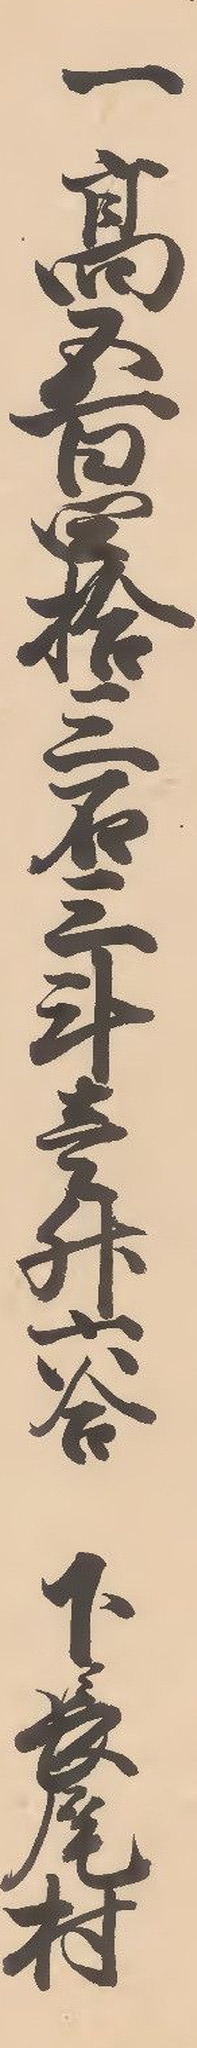一高五百四拾三石三斗壱升六合下長尾村
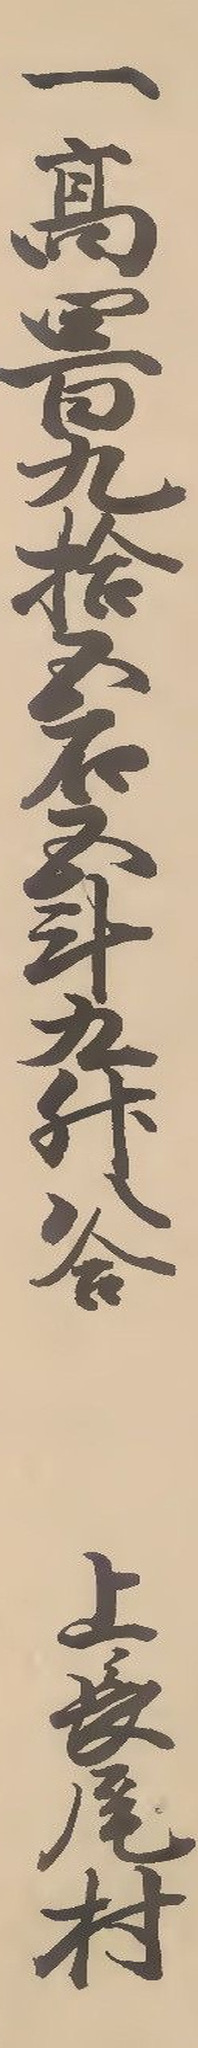一高四百九拾五石五斗九升八合上長尾村
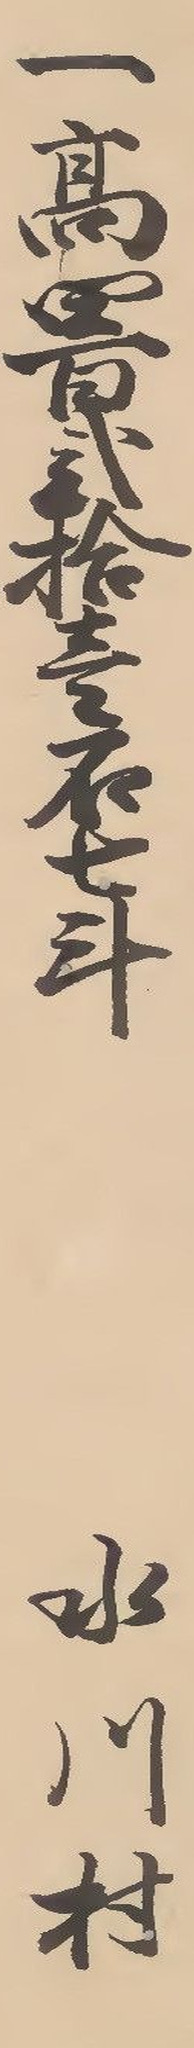一高四百弐拾壱石七斗水川村
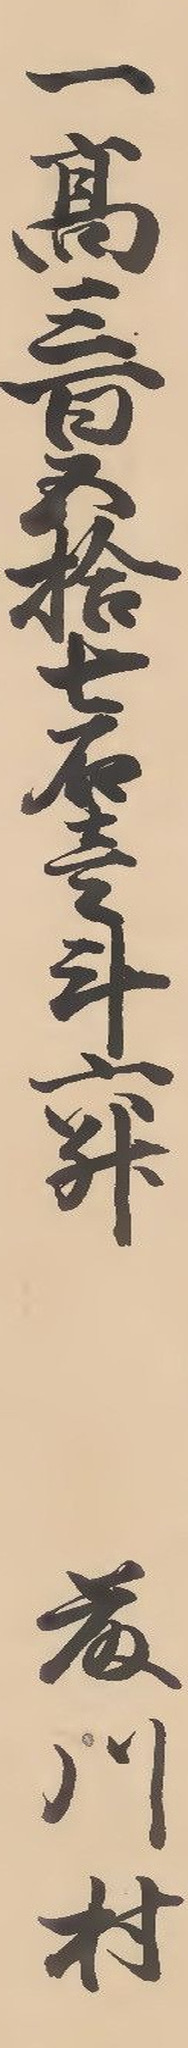一高三百五拾七石壱斗六升藤川村
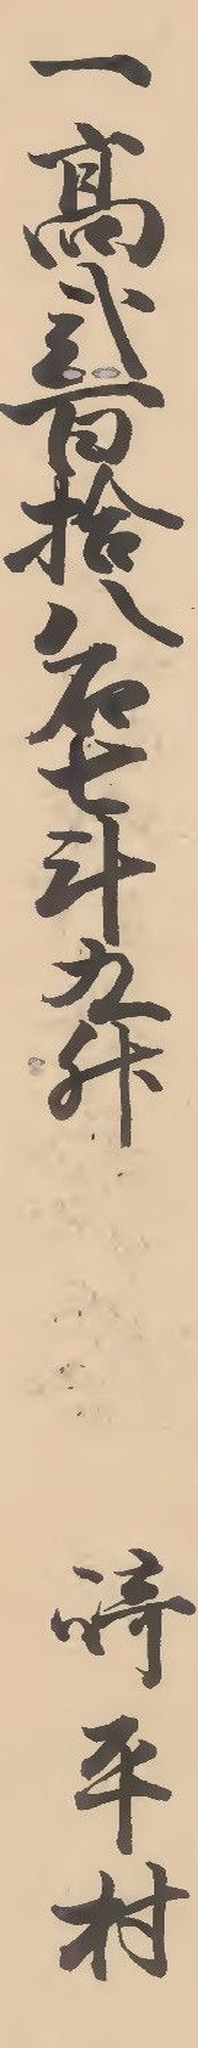一高弐百拾八石七斗九升崎平村

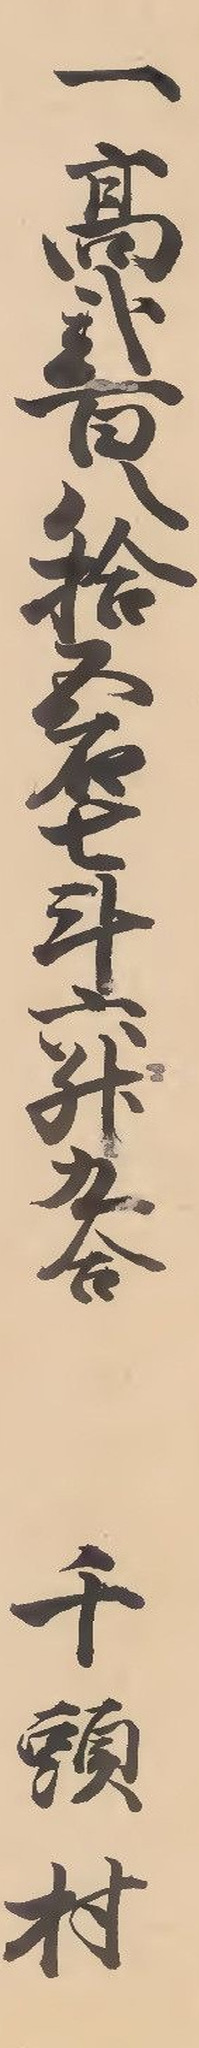一高弐百八拾五石七斗六升九合千頭村
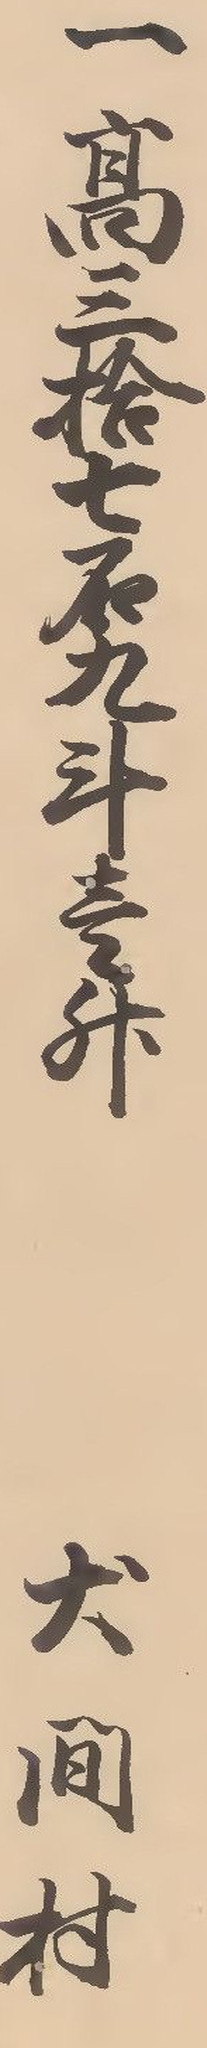一高三拾七石九斗壱升犬間村
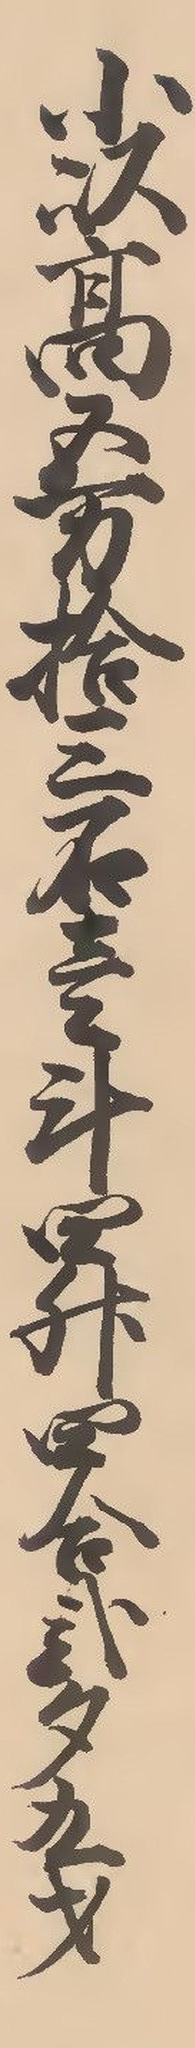小以高五万拾三石壱斗四升四合弐勺九才

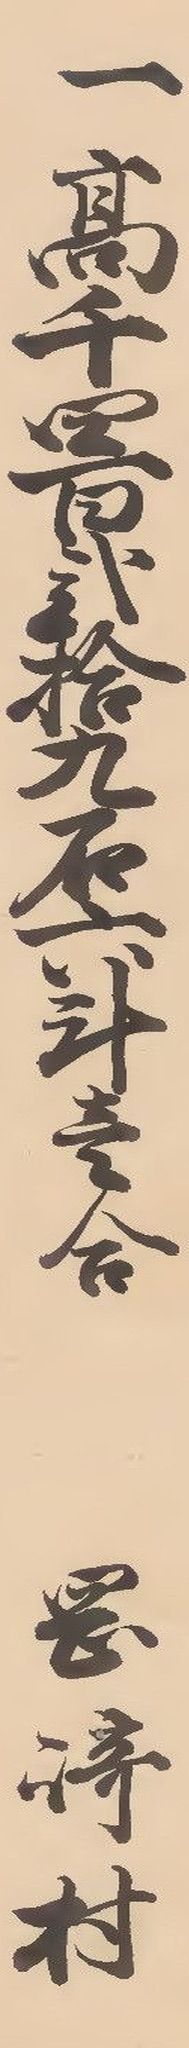一高千四百弐拾九石六斗壱合岡崎村
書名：遠江国郷帳
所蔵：国立公文書館 National Archives of Japan
